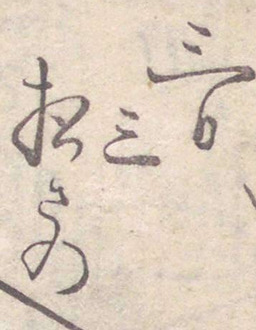夜さの
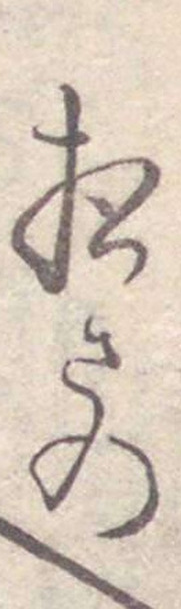夜さの
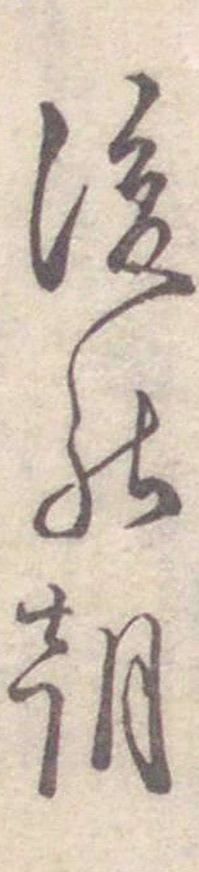後の朝
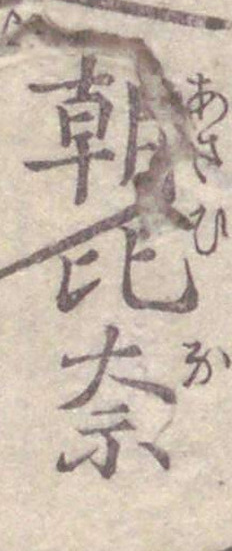朝比奈

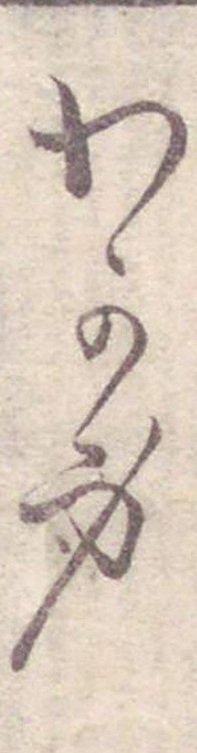わか身
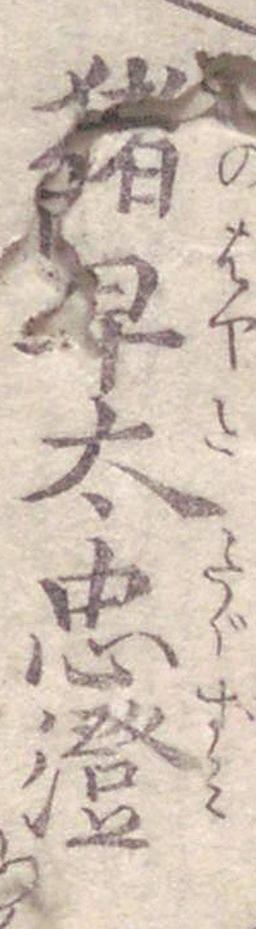猪早太忠澄
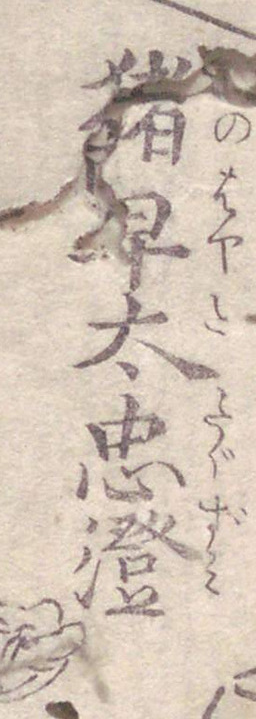猪早太忠澄
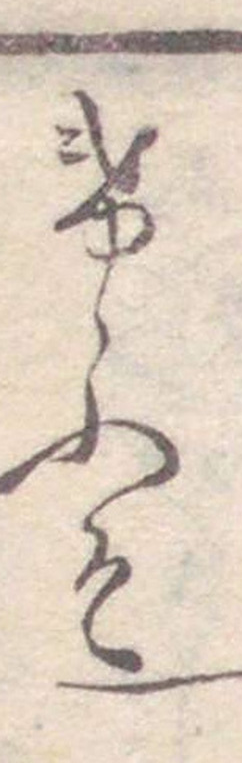けふそ
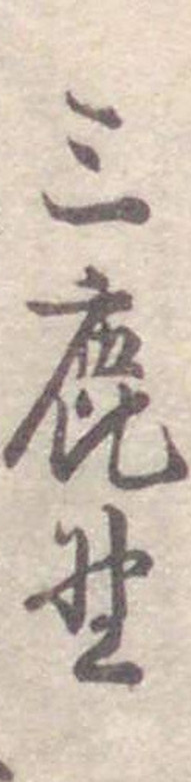三鹿野
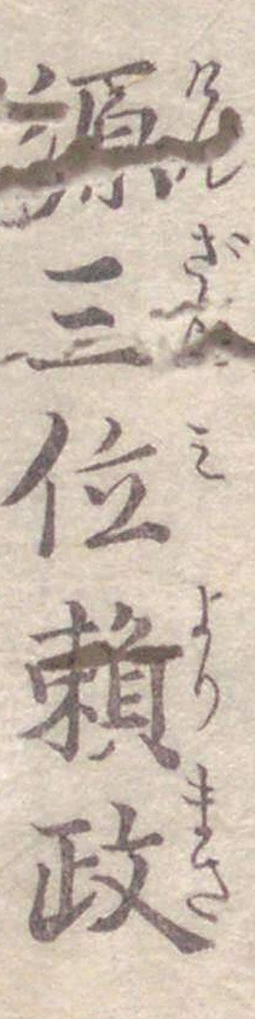源三位頼政

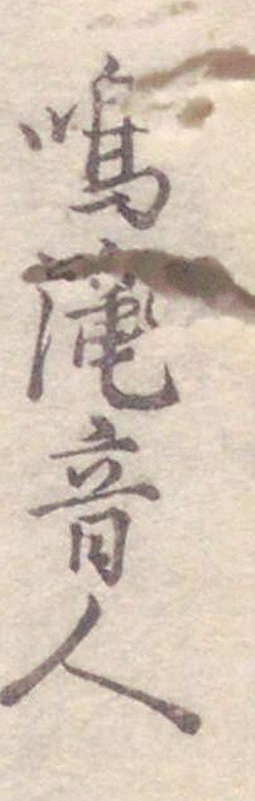鳴滝音人
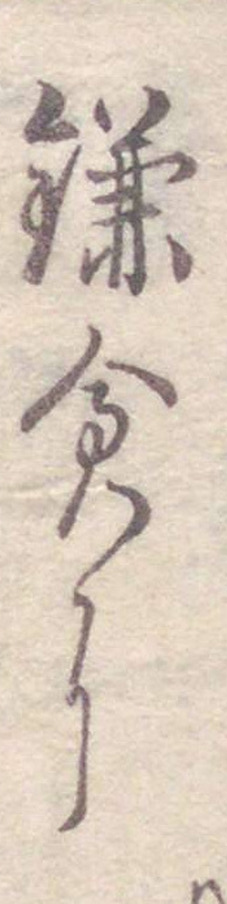鎌倉に
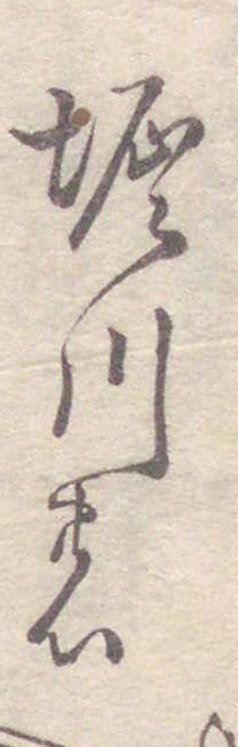堀川の
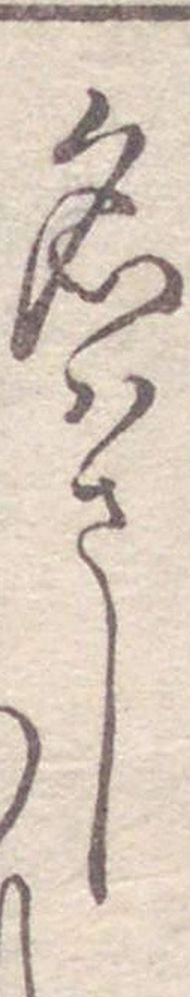名はさし
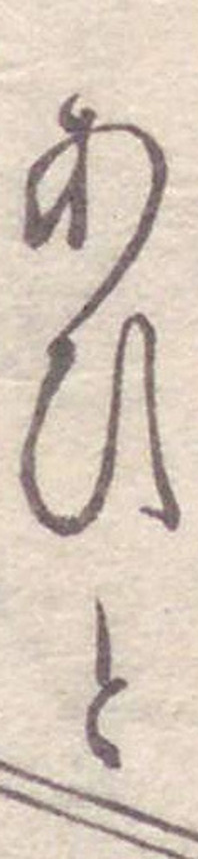あひと
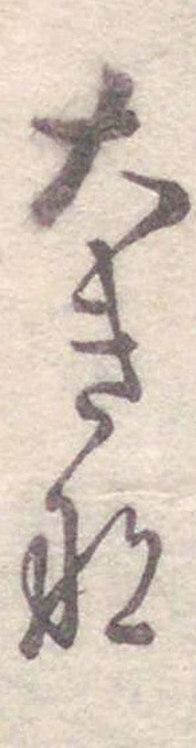大きな
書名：繪本八十宇治川
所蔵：九州大学中央図書館 国文学研究資料館
